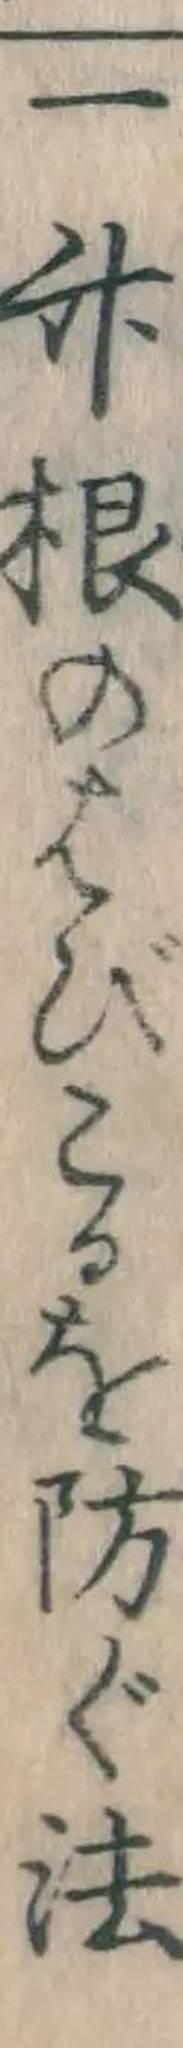一竹根のはびこるを防ぐ法
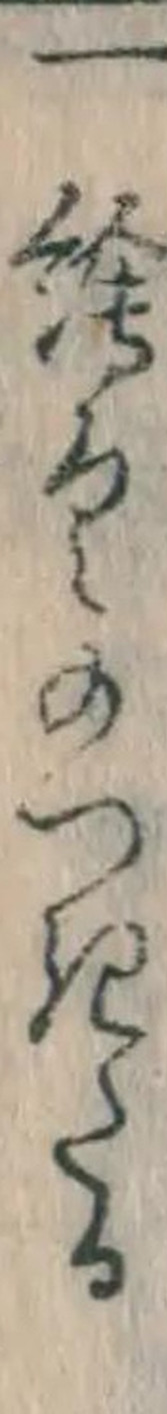一絵具のつきたる
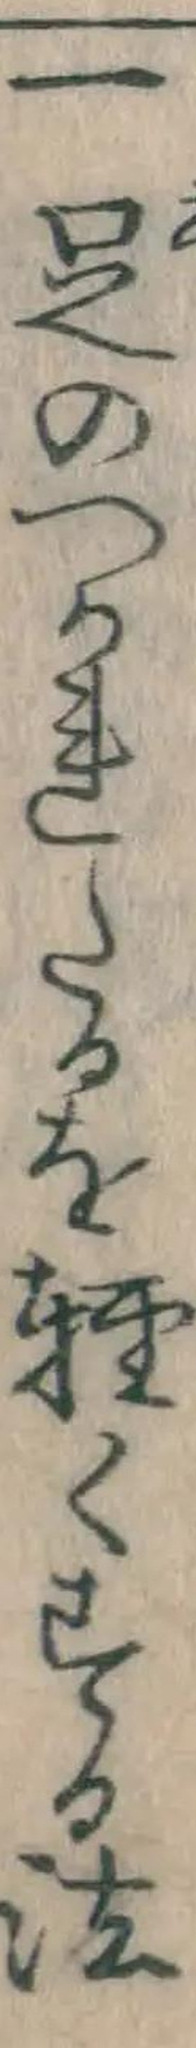一足のつかれたるを軽くする法

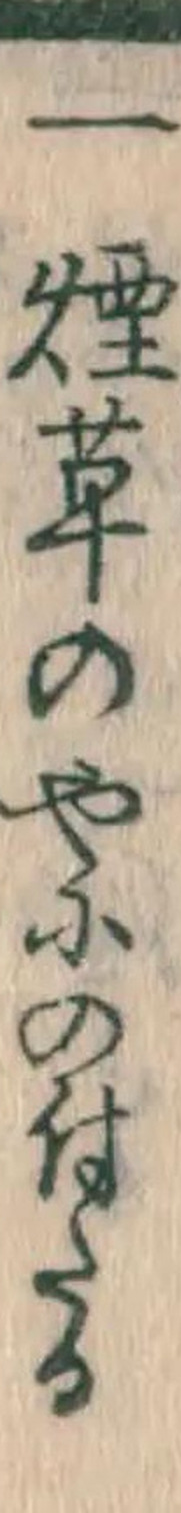一煙草のやにの付たる
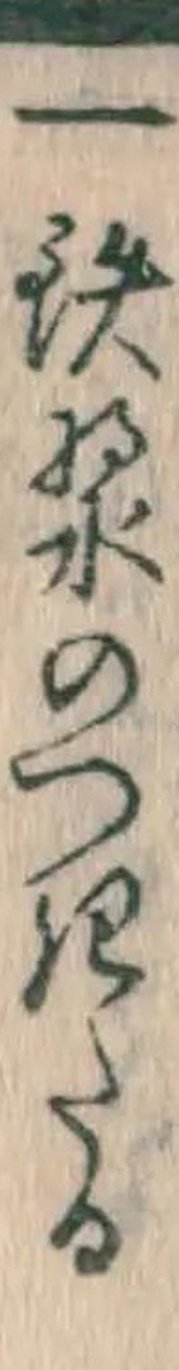一鉄漿のつきたる
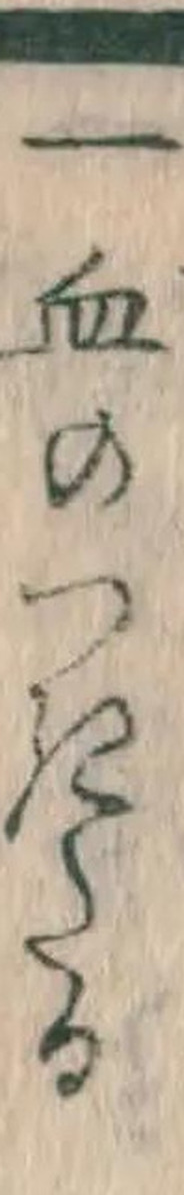一血のつきたる
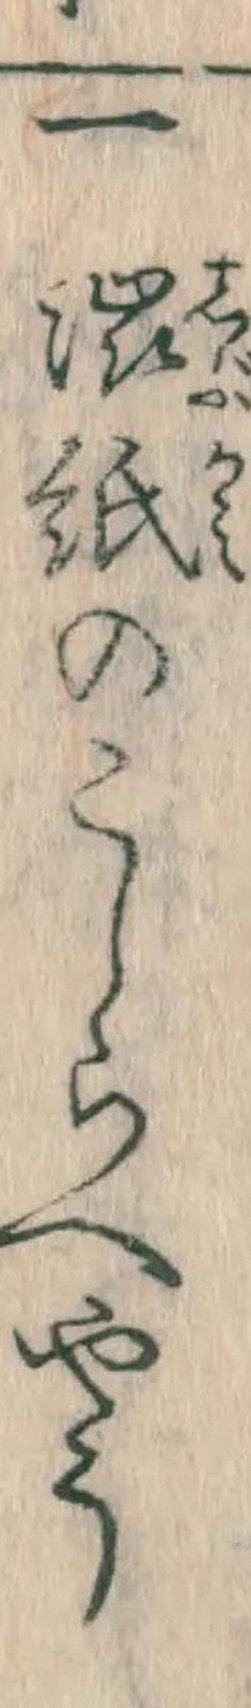一渋紙のこしらへやう
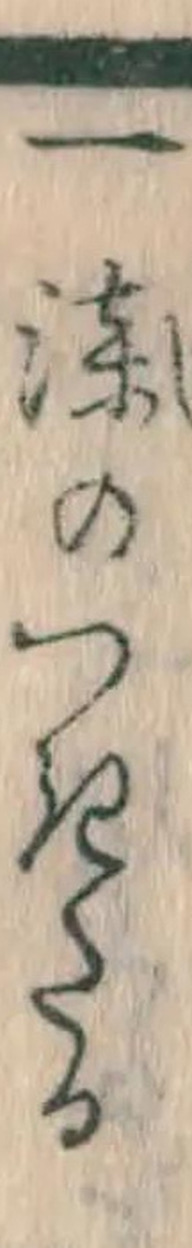一漆のつきたる
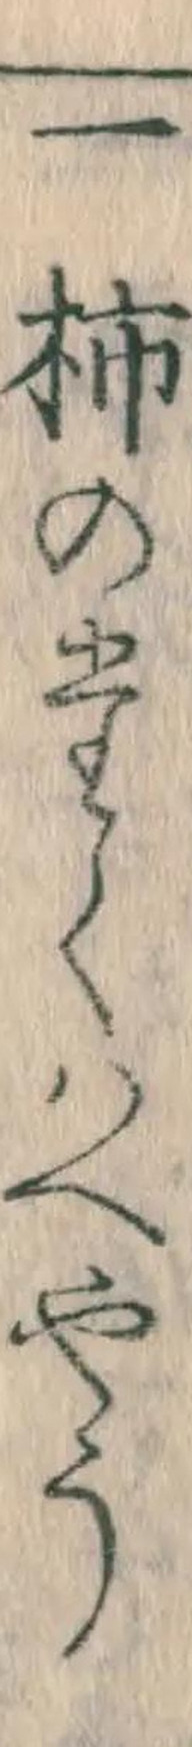一柿のたくはへやう
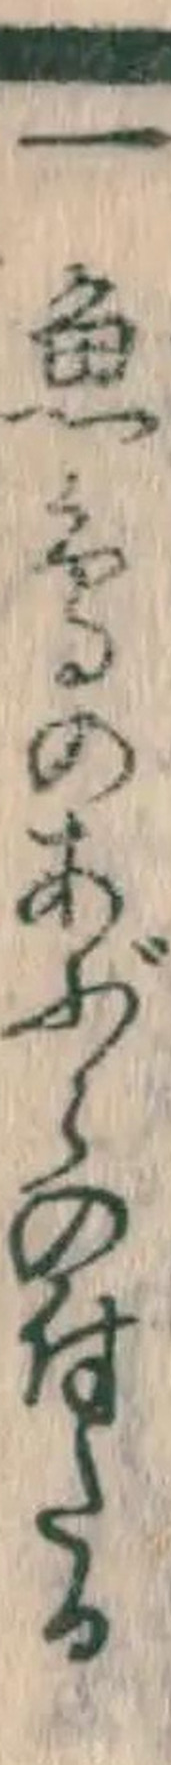一魚鳥のあぶらの付たる
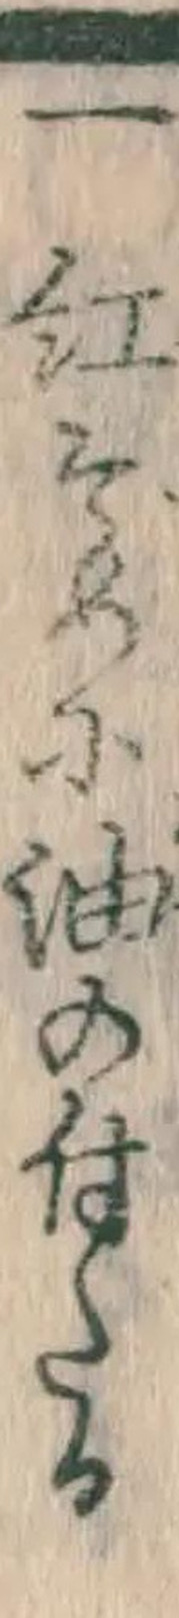一紅ぞめに油の付たる
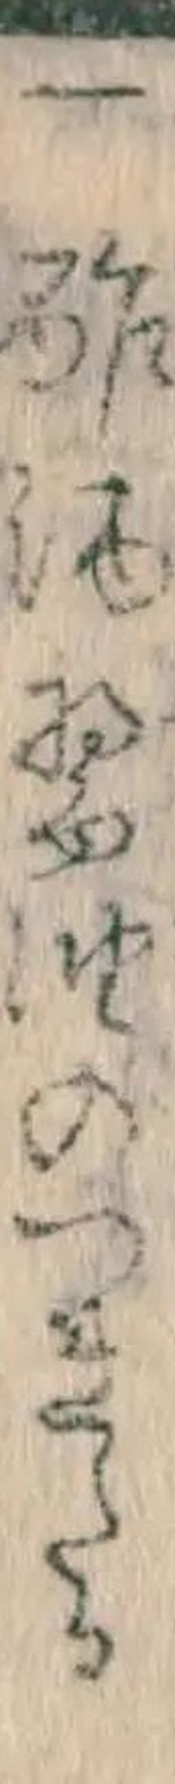一酢酒醬油のつきたる
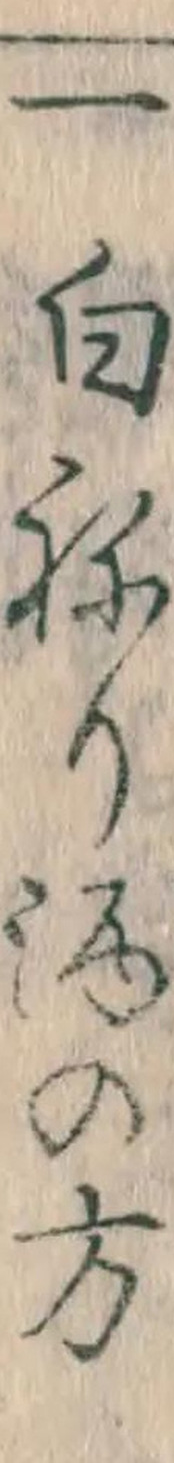一白ねり酒の方
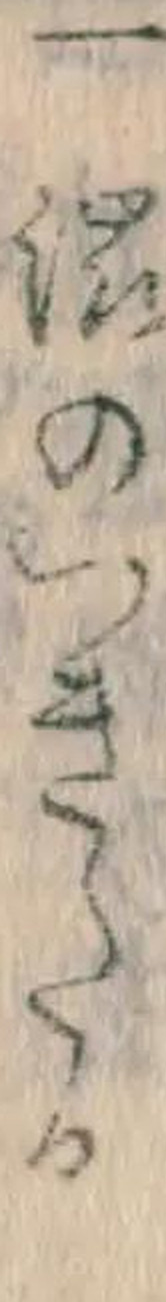一渋のつきたる
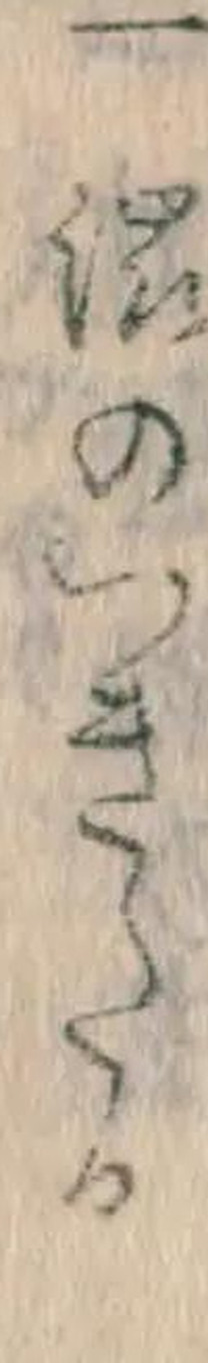一血のつきたる
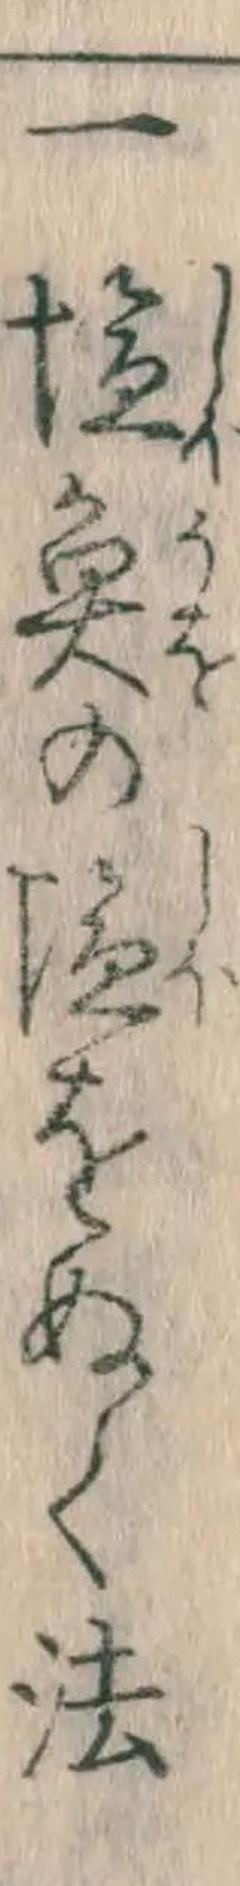一塩魚の塩をぬく法
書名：広益秘事大全 3巻. [1]
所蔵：国立国会図書館 National Diet Library, JAPAN
